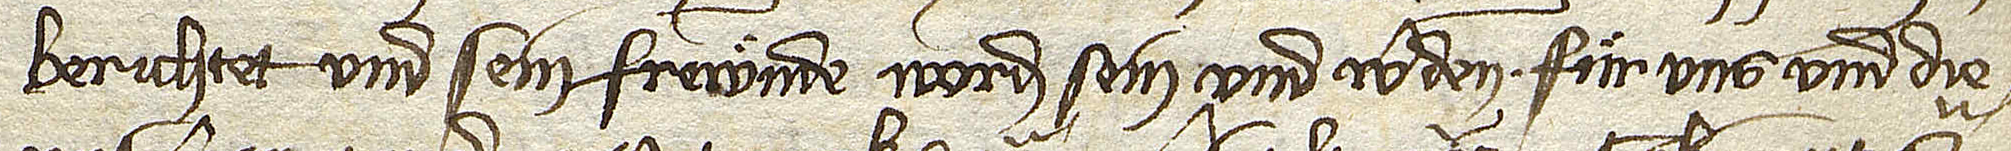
berichtet vnd ſein freẅnde word* ſein vnd w*den . Für vns vnd die
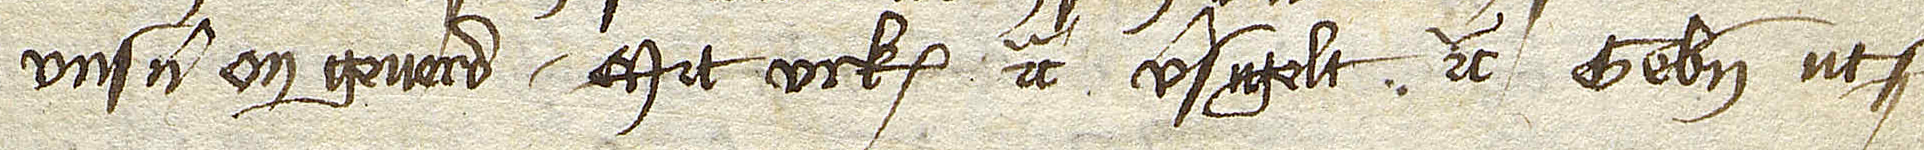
vnſn* on geuerd / Mit vrk* ec* v*ſigelt ec* Gebn* ut ſ*
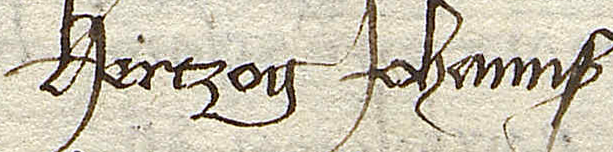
Hercʒog Iohannſ*
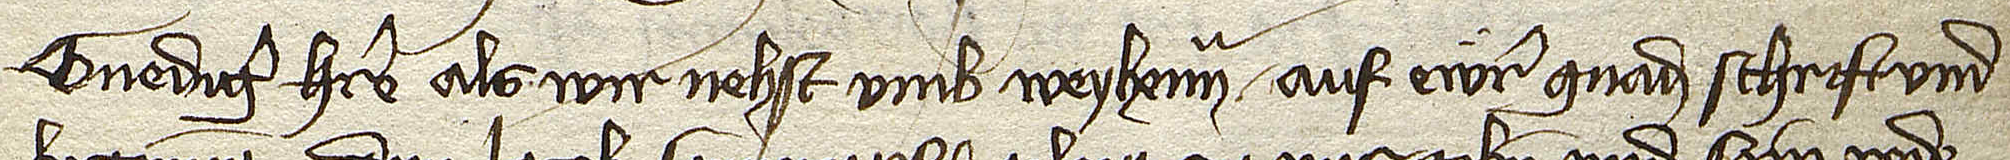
Gnedig* h*re als wir nehſt vmb weyheim* / auf eẅr* gnad* ſchrift vnd
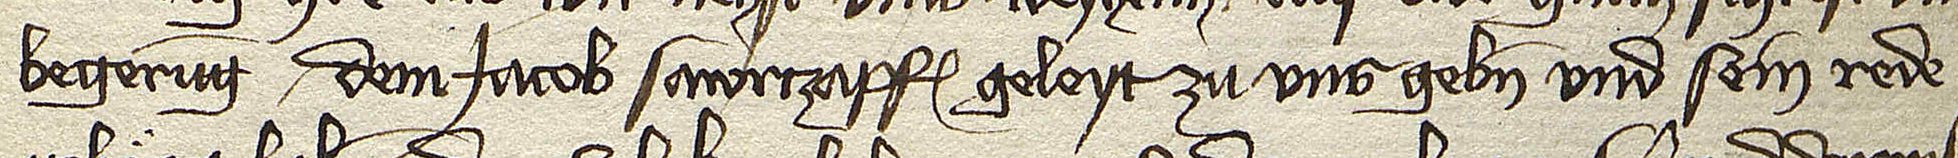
begeru*g / dem Iacob ſawrcʒapf* geleyt ʒu vns gebn* vnd ſein rede
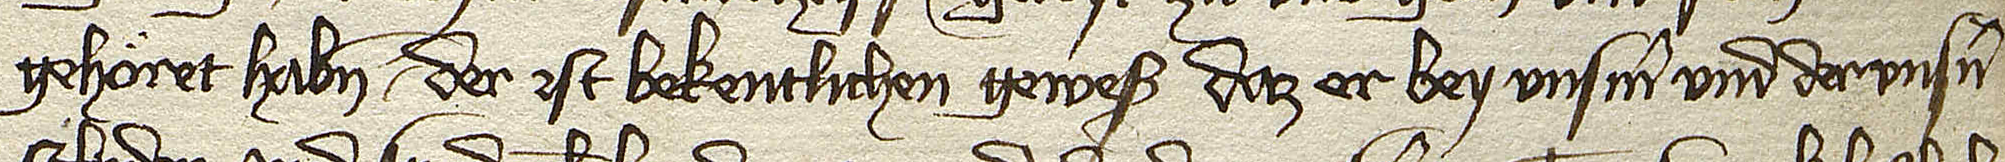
gehöret habn* / Der iſt bekentlich geweſ* daʒ er bey vnſm* vnd der vnſn*
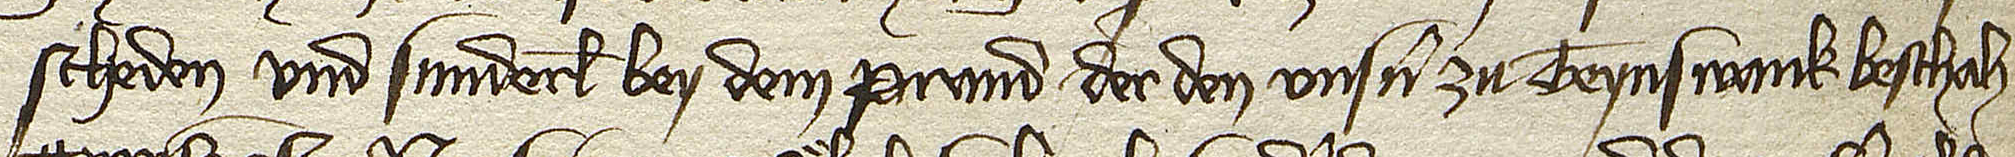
ſcheden vnd ſunderl* bey dem Prand / der den vnſn* ʒu Teynſwank beſchah
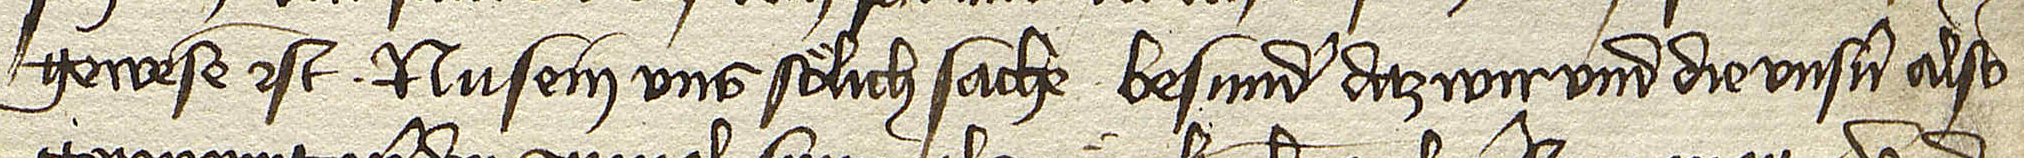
geweſe* iſt . Nu ſein vns ſölich ſache beſund* daʒ wir vnd die vnſn* alſo
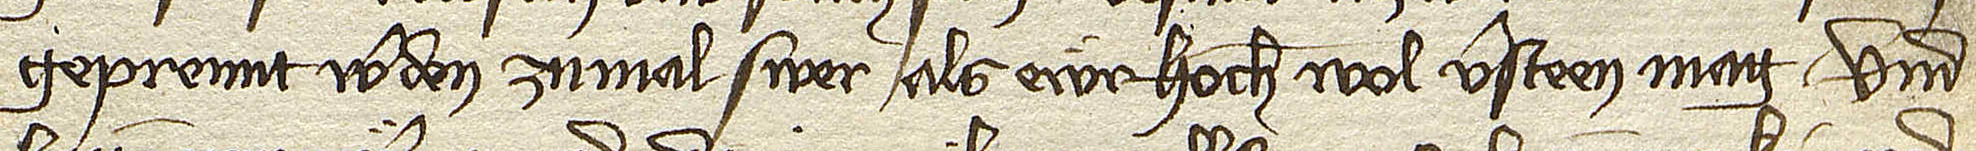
geprennt w*den ʒumal ſwer als eẅr hoch* wol v*ſteen mag / Vnd
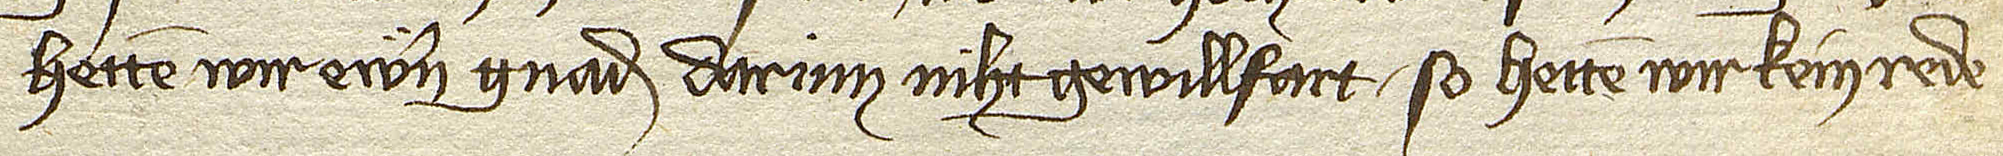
hette* wir eẅ*n gnad* darinn niht gewillfart / ſo hette* wir kein rede
